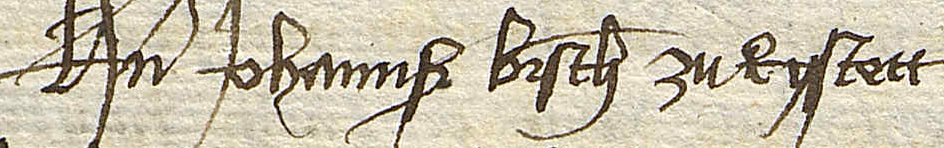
Hn* Iohannſ* biſch* ʒu Eyſtett
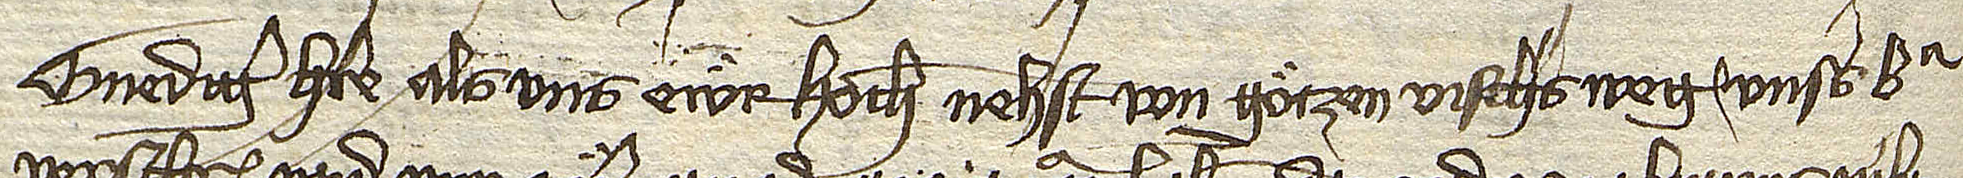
Gnedig* h*re als vns eẅr hoch* nehſt von göcʒen viſch*s weg* vnſ*s b*
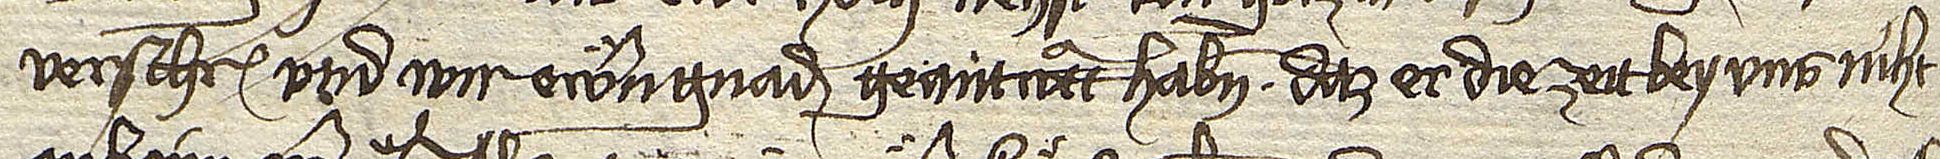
verſchr* vnd wir eẅ*n gnad* geantw*tt habn* . daʒ er die ʒeit bey vns niht
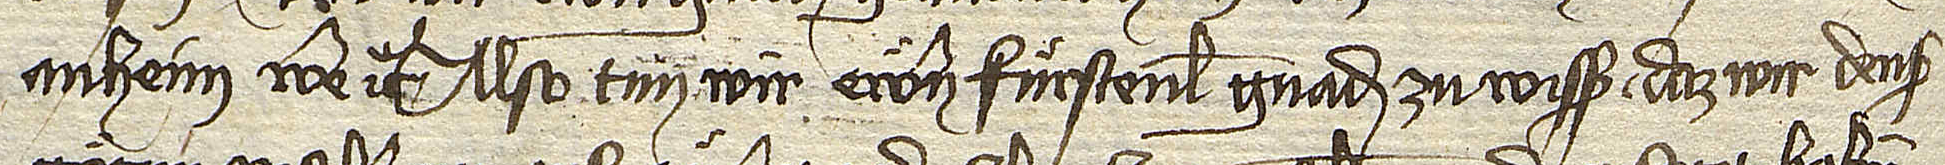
anheim w*e ec* Alſo tun wir eẅ*n fürſtenl* gnad* ʒu wiſſ* / daʒ wir denſ*
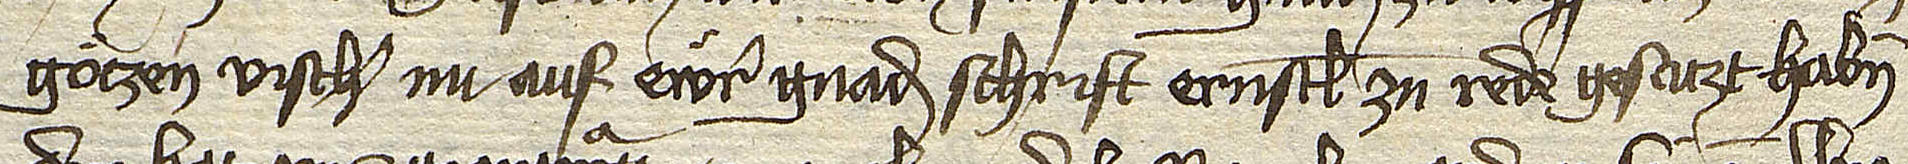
göcʒen viſch* nu auf eẅr* gnad* ſchrift ernſtl* ʒu rede geſacʒt habn*
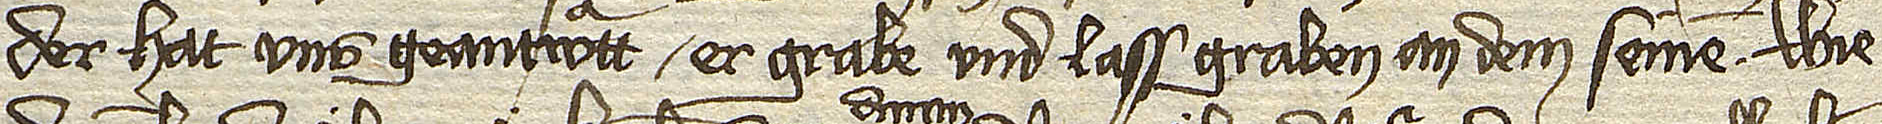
der hat vns geantw*tt / er grabe vnd laſſ graben an dem ſeine* . Wie
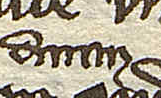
daran
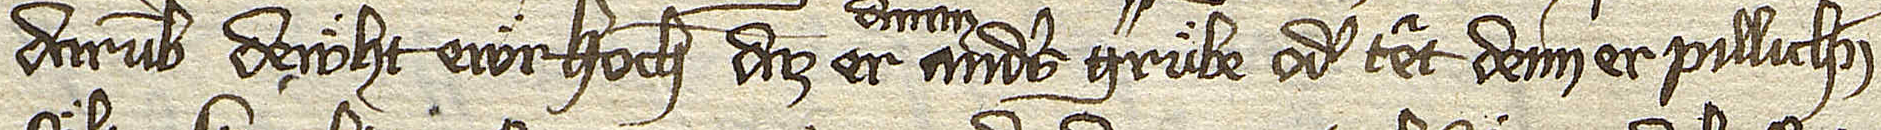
darub* deẅht eẅr hoch* daʒ er and*s grübe od* tët denn er pillichn*
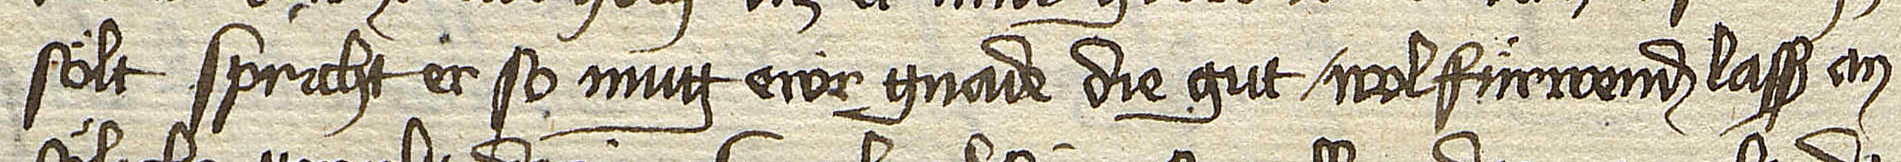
ſölt ſpricht er ſo mug eẅr gnade die gut / wol fürwend* laſſ* an
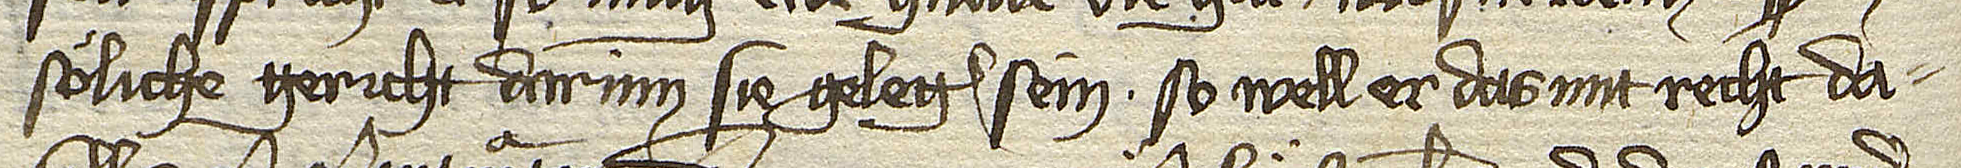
ſöliche gericht darinn ſie geleg* ſein . ſo well er das mit recht da =
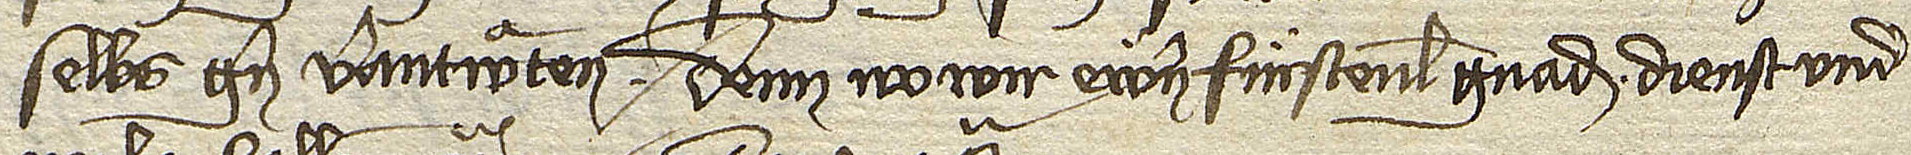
ſelbs g*n v*antw*ten . Denn wo wir eẅ*n fürſtenl* gnad* . dienſt vnd
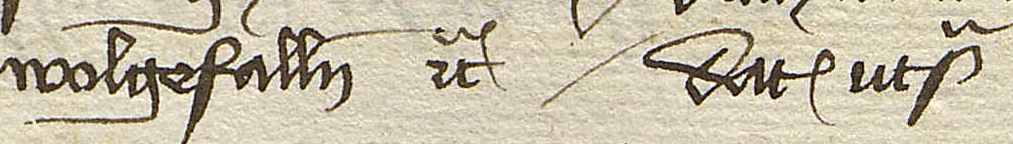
wolgefalln* ec* / Dat* ut ſ*
